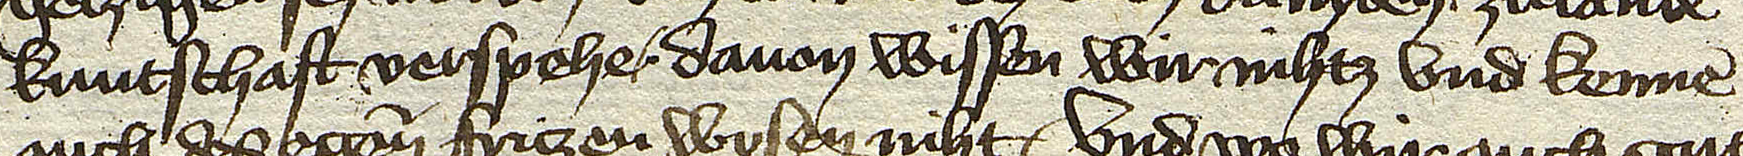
kuntſchaft verſpehe / . dauon wiſſen wir nihtʒ vnd kenne*
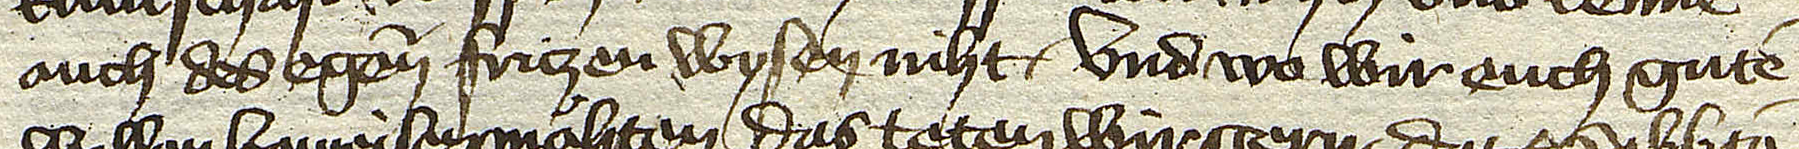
auch des egen* fricʒen Wyſen niht / Vnd wo wir euch gute*
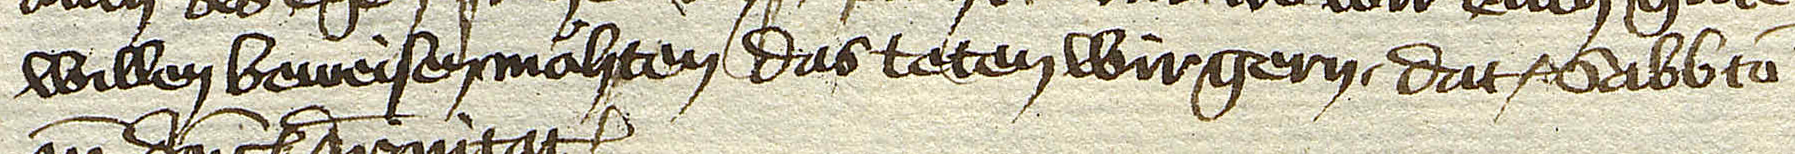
willen beweiſen möhten das teten wir gern . Dat* Sabbto*
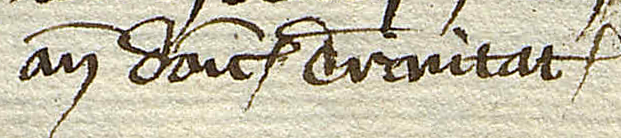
an* doic* Trinitat*
